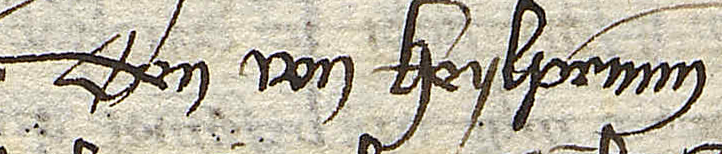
Den von Heylprunn*
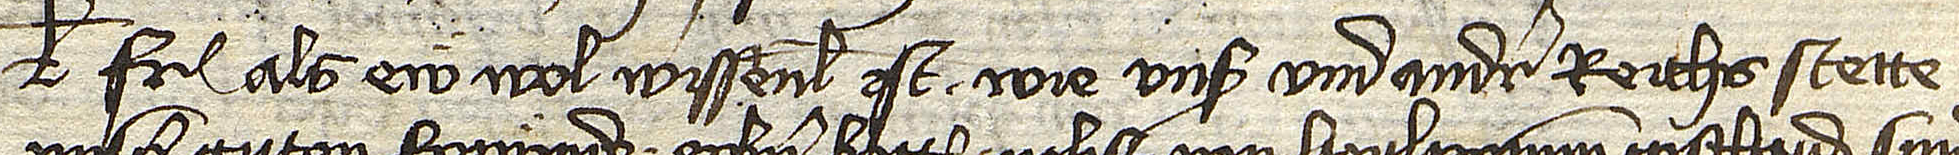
L* Fr* als eẅ wol wiſſenl* iſt / wie vnſ* vnd andr* Reichs ſtette
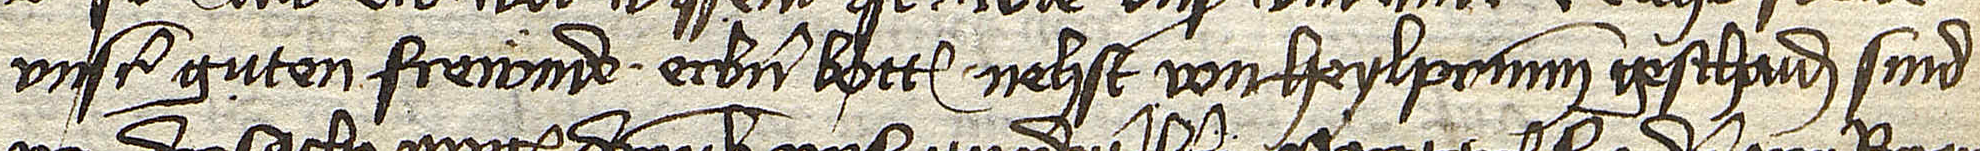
vnſr* guten freẅnde . erbn* bott* / nehſt von heylprunn* geſchaif* ſind
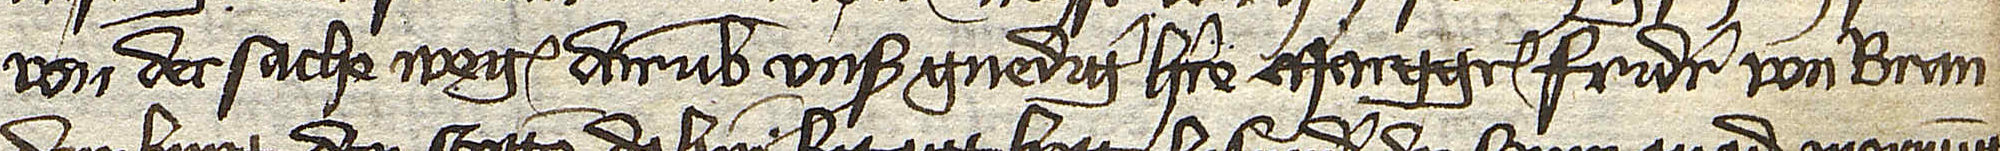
von der ſache weg* darub* vnſ* gnedig* h*re Marggr* fridr* von Bran
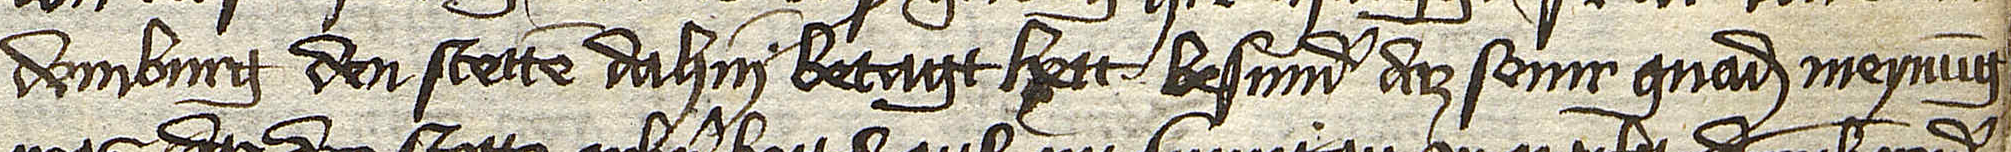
demburg den ſtette* dahin betagt hett beſund* daʒ ſeinr gnad* meynu*g
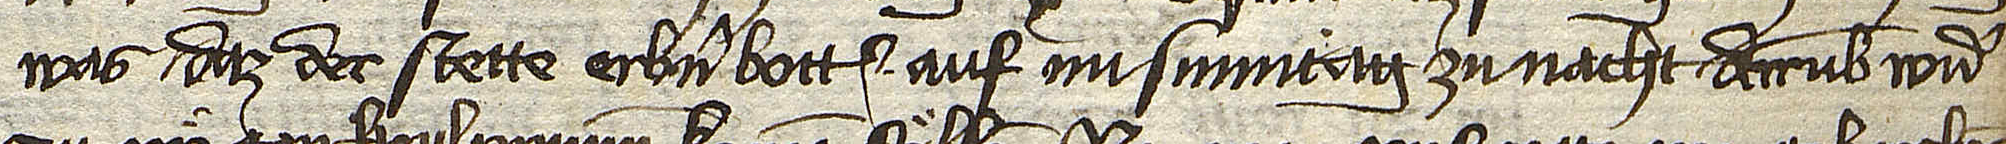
was / daʒ der ſtette erbn* bott* . auf n ſunntag ʒu nacht darub* wid*
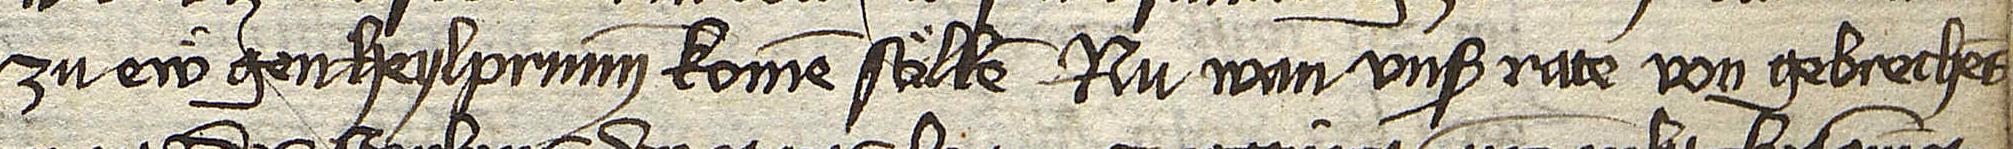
ʒu eẅ gen heylprunn* kome* ſölle* Nu wan vnſ* rate von gebreches*
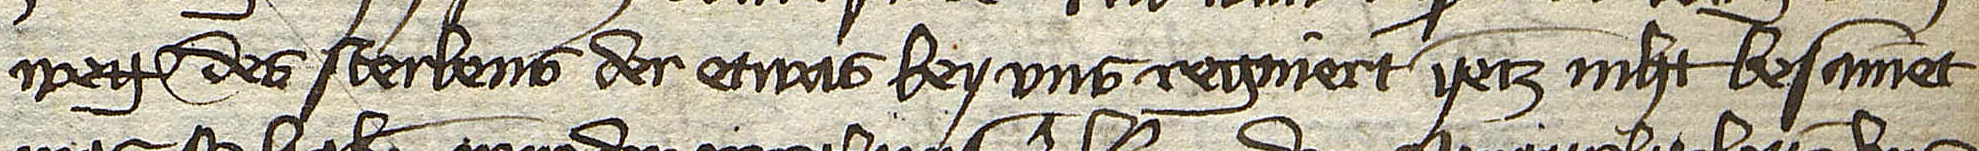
weg* des ſterbens der etwas bey vns regniert yecʒ* niht beſam*et
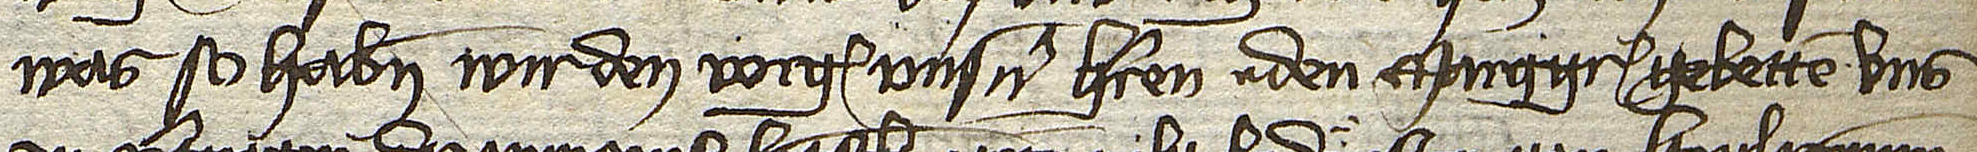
was ſo habn* wir den vorg* vnſn* h*ren ~ den Marggr* gebette* vns
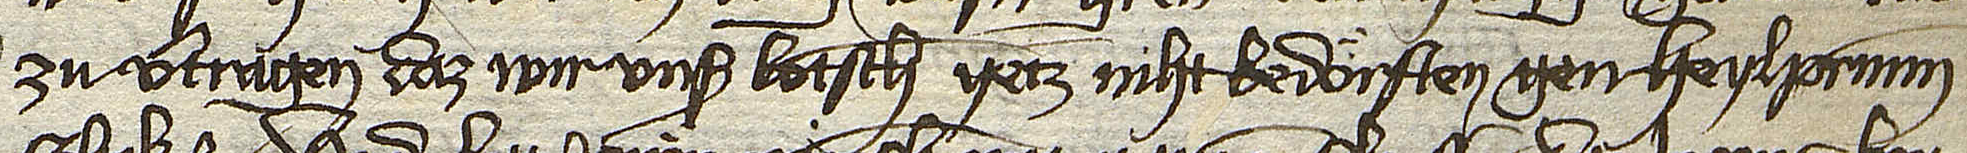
ʒu v*tragen daʒ wir vnſ* botſch* yecʒ* niht bedörften gen Heylprunn*
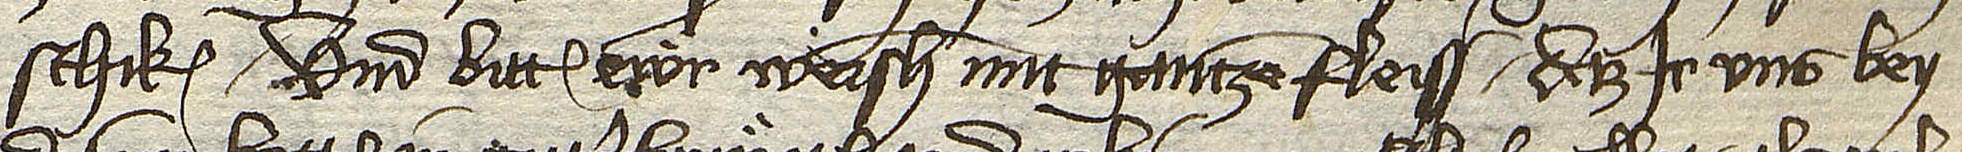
ſchik* / Vnd bitt* eẅr weiſh* mit gancʒe* fleiſſ / daʒ Ir vns bey
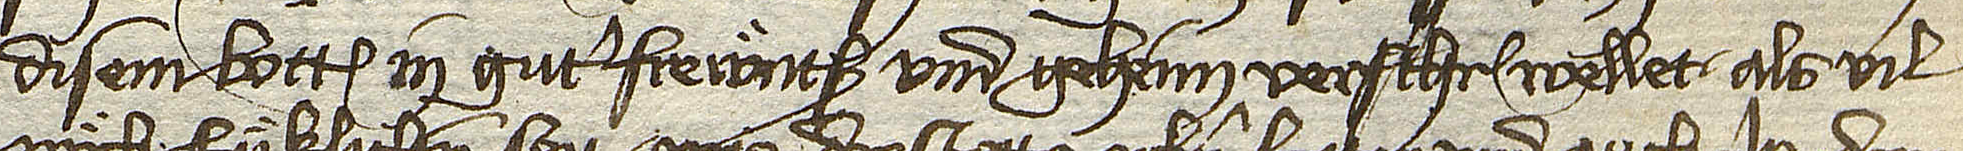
diſem bott* in gut* freẅntſ* vnd geheim verſchr* wellet / als vil
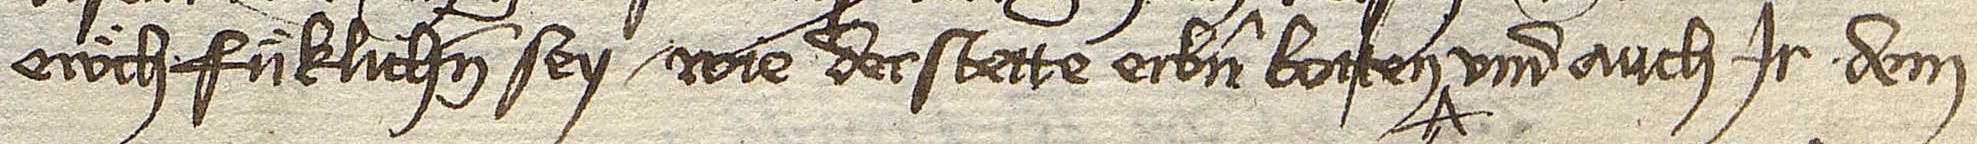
eẅch fürklich*n ſey / wie der ſtette erbn* botten vnd auch Ir . dem
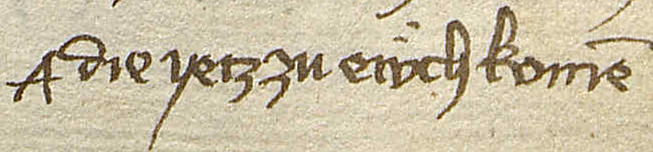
die yecʒ ʒu eẅch kome*
